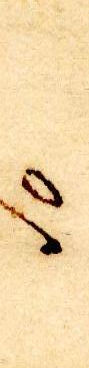To
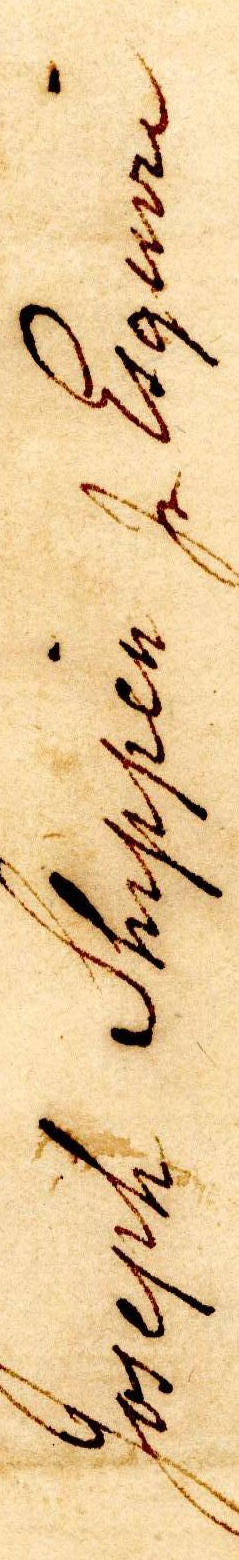Joseph Shippen Jr Esquire
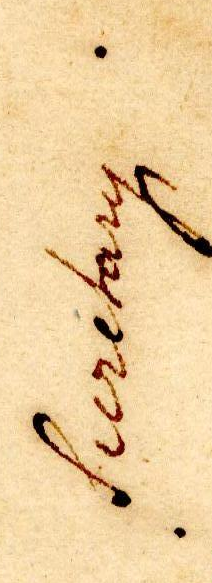Secretary
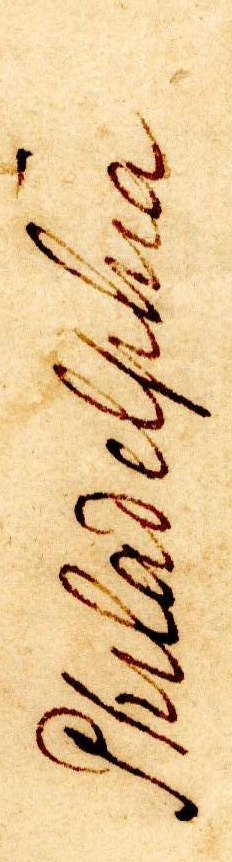Philadelphia
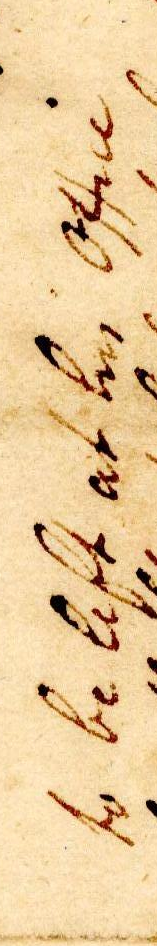to be left at his Office
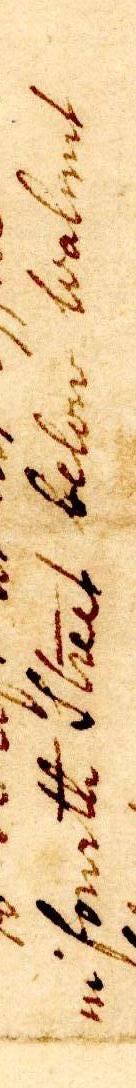in fourth Street below Walnut
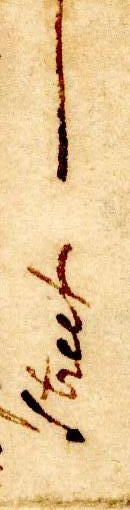Street-
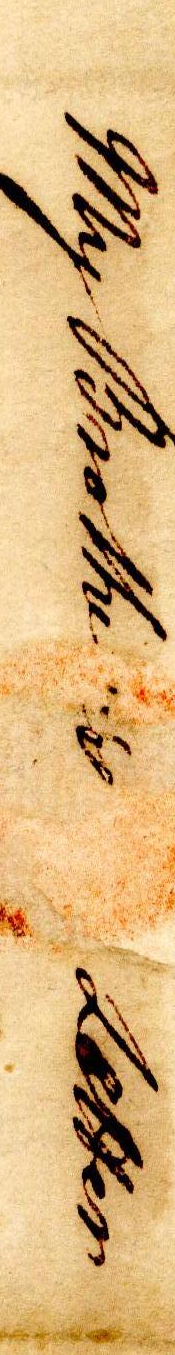My Brother's Letter
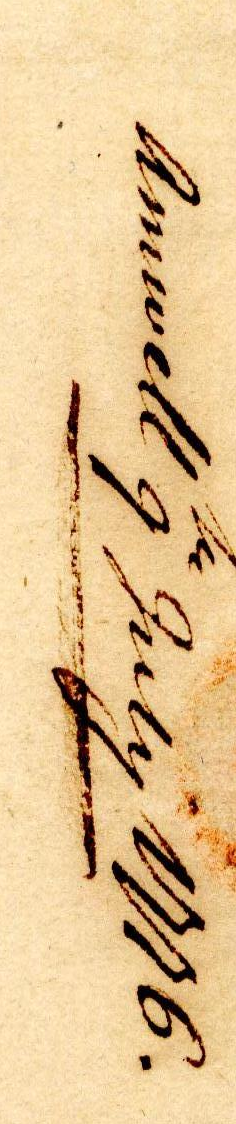Amwell 9^th July 1776.
